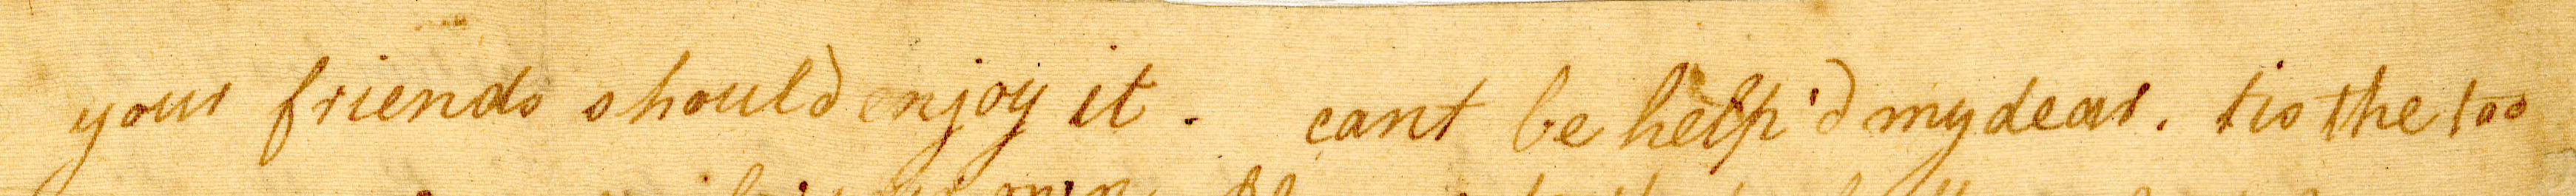your friends should enjoy it. cant be help'd my dear tis the too
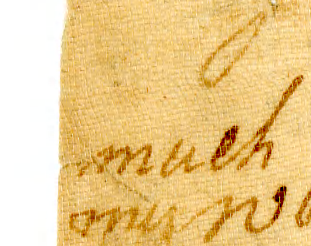much
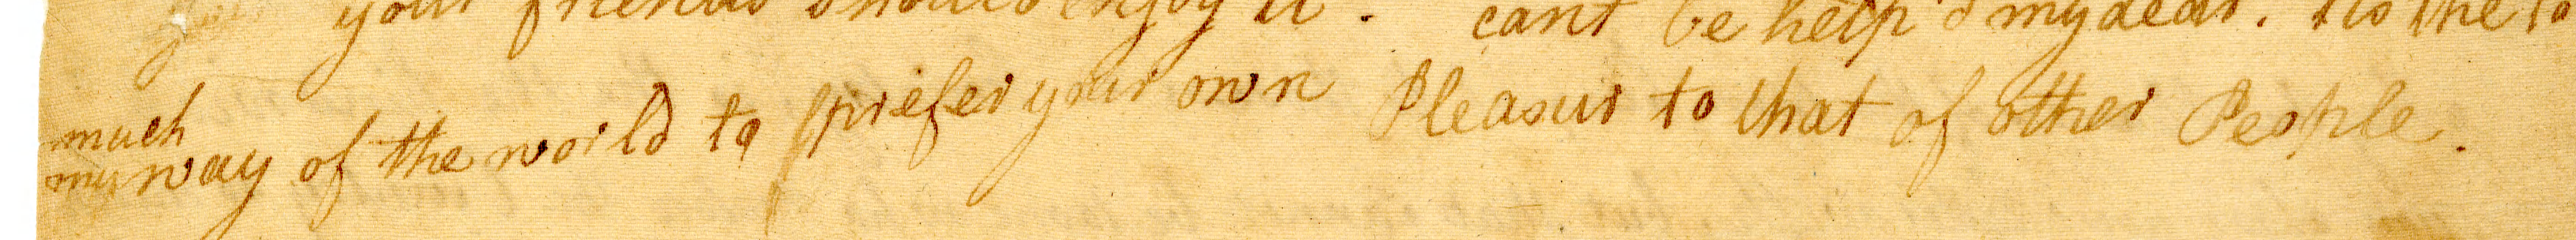mu way of the world to prefer your own Pleasur to that of other People.
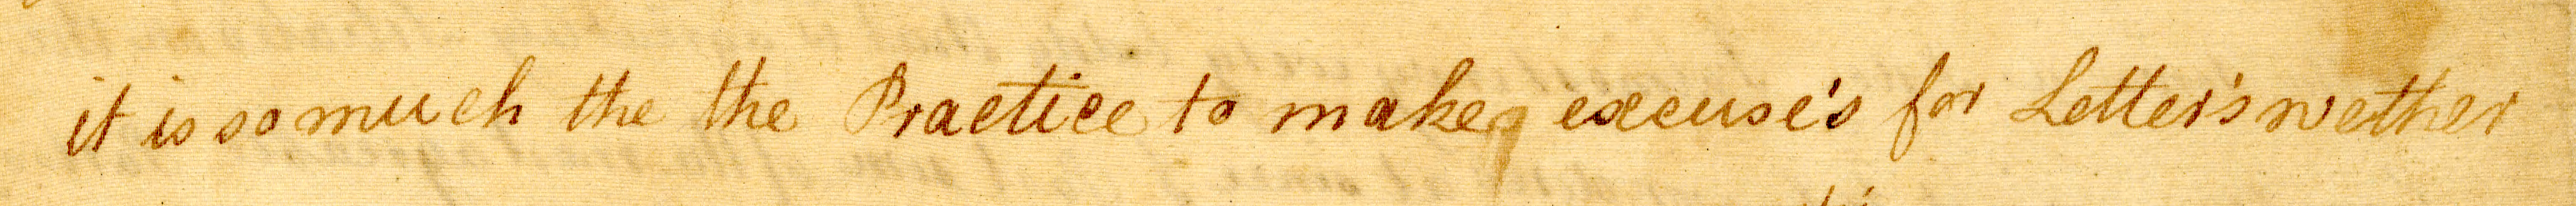it is so much the the Practice to make excuse's for Letter's wether
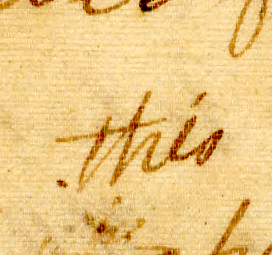this
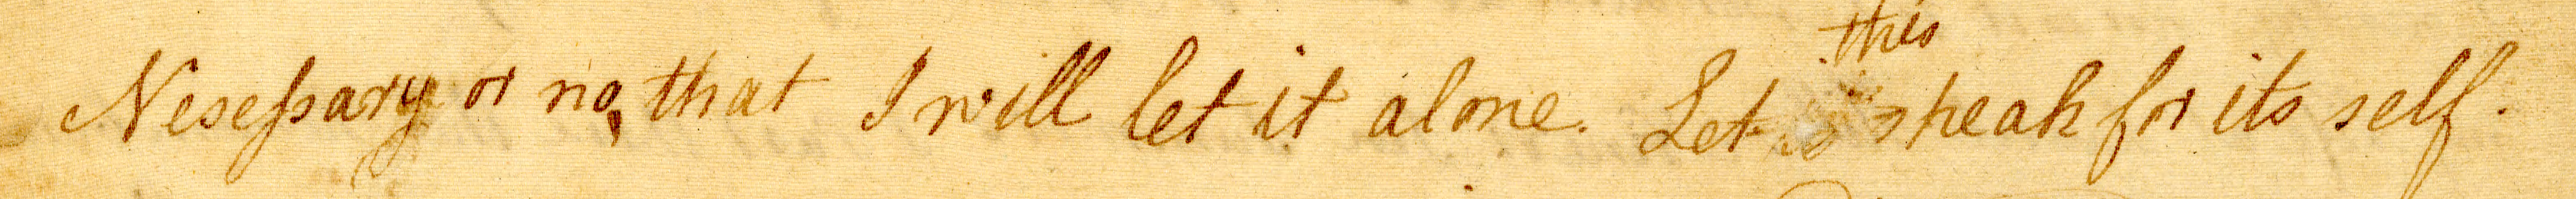Nesessary or no, that I will let it alone. Let speak for its self
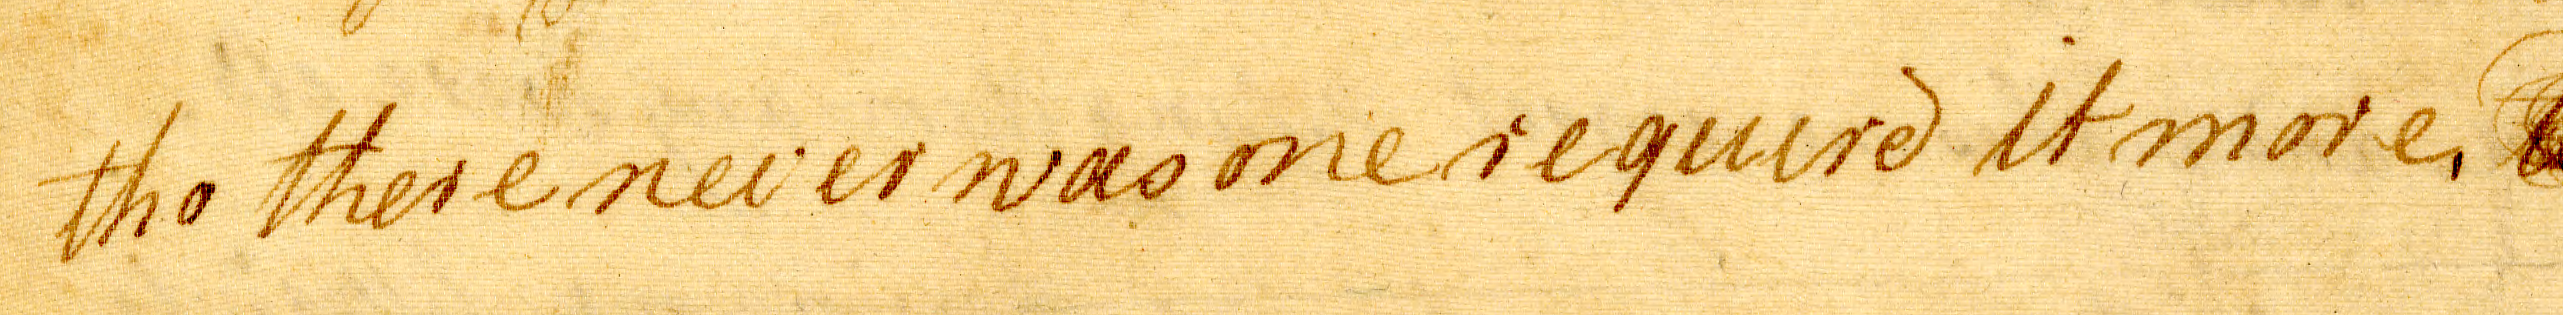tho there never was one requird it more
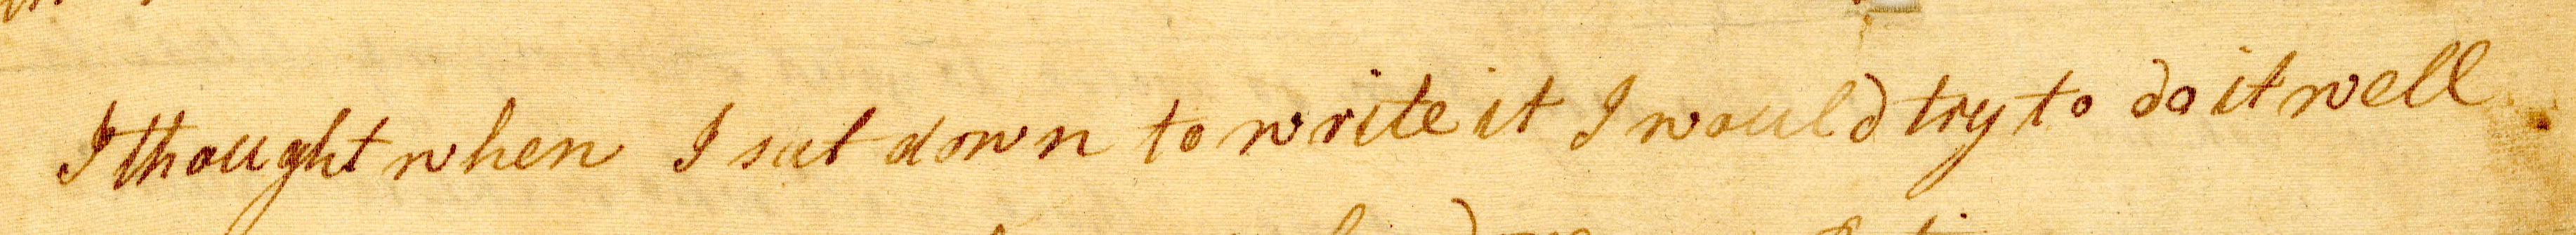I thought when I sat down to write it I would try to do it well
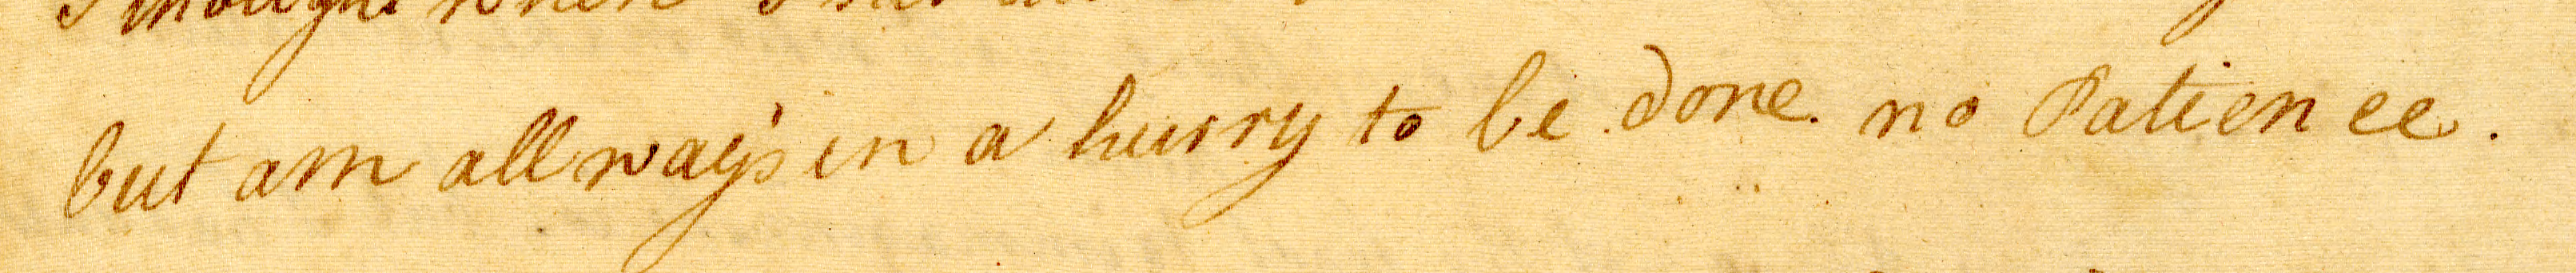but am allway's in a hurry to be done no Patience.
